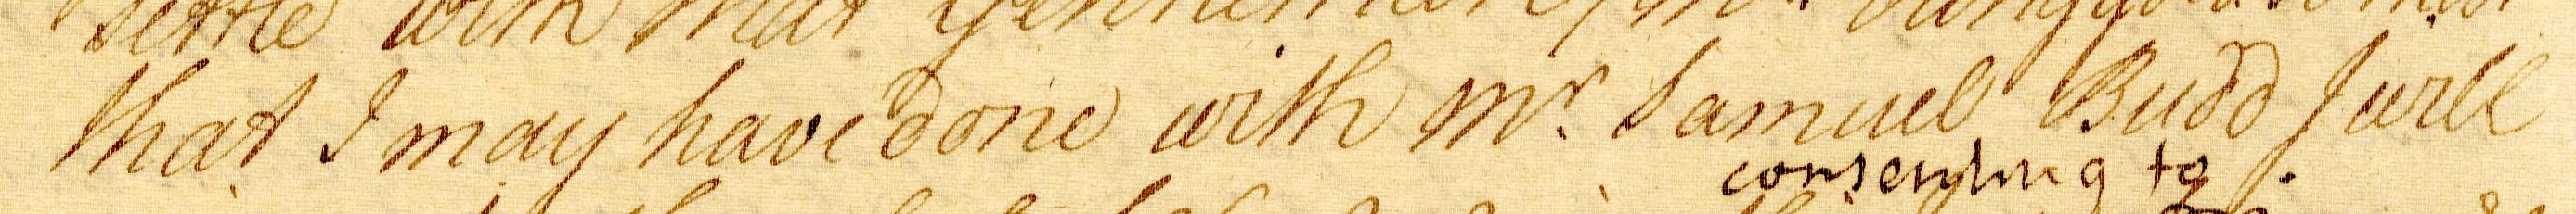that I may have done with M^r. Samuel Budd I will
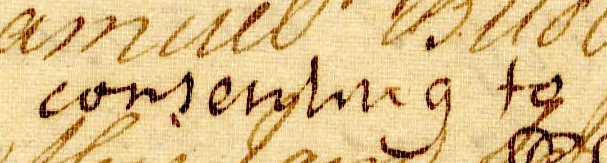consenting to
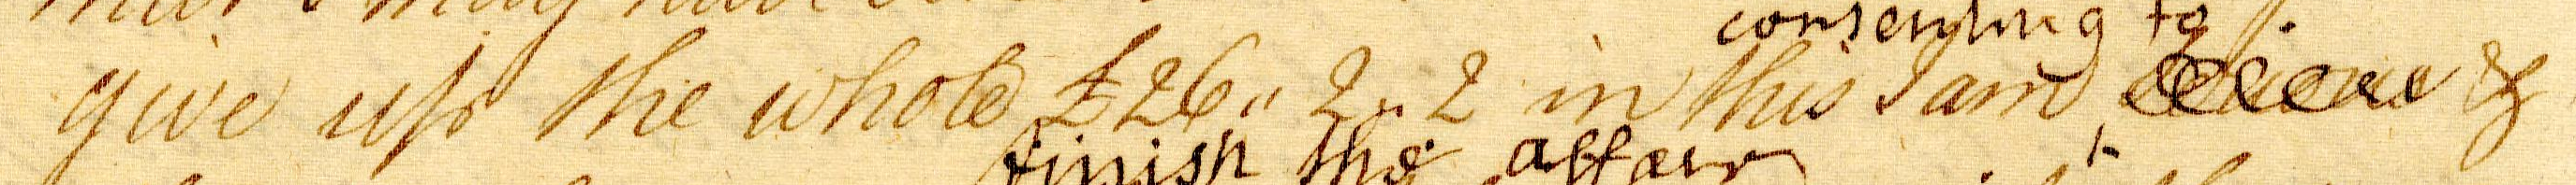give up the whole £26..2..2 in this I am ^ [____] &
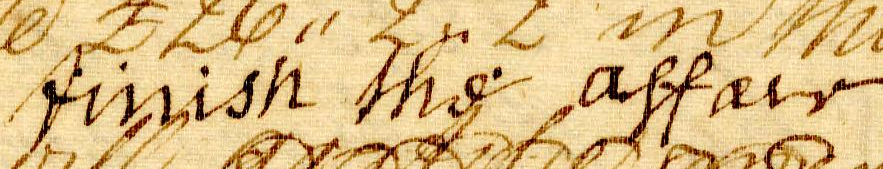finish the affair
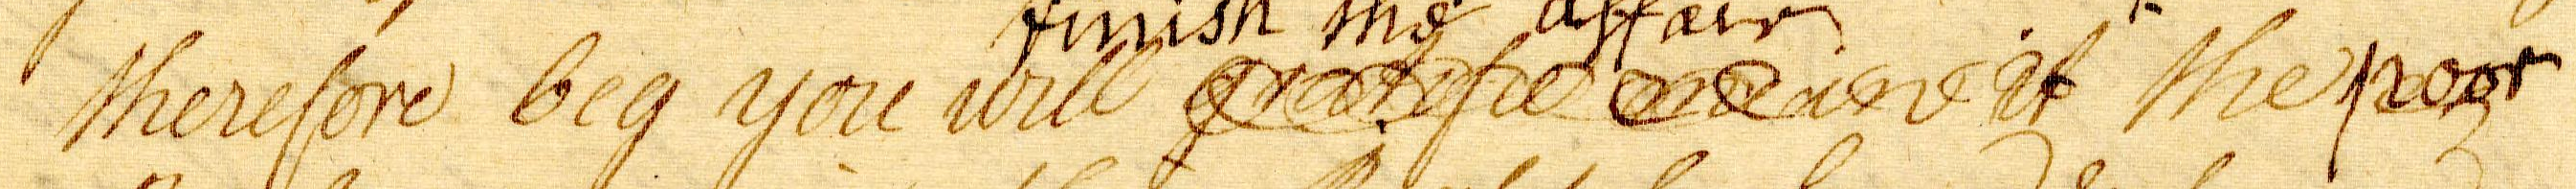therefore beg you will [__________] the poor
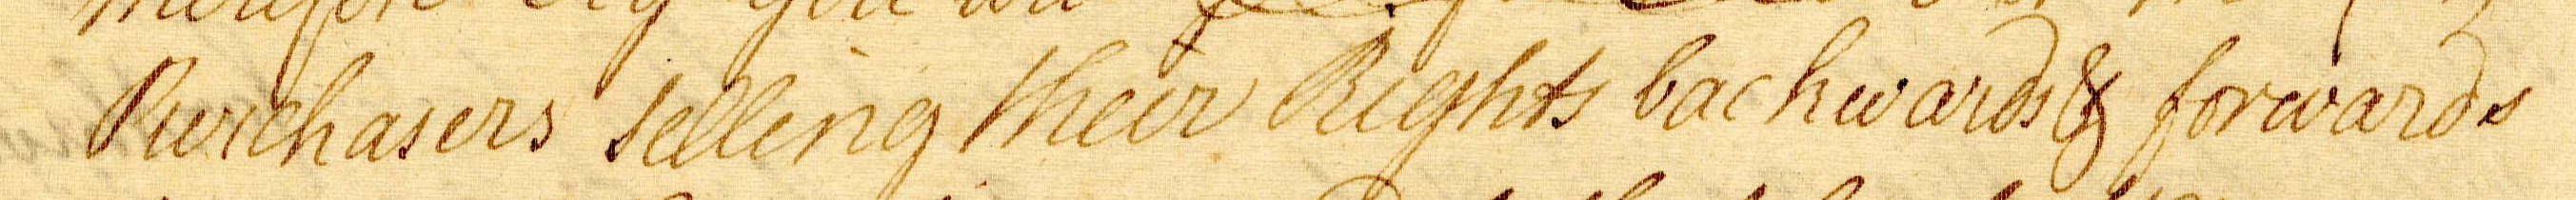Purchasers selling their Rights backwards & forwards
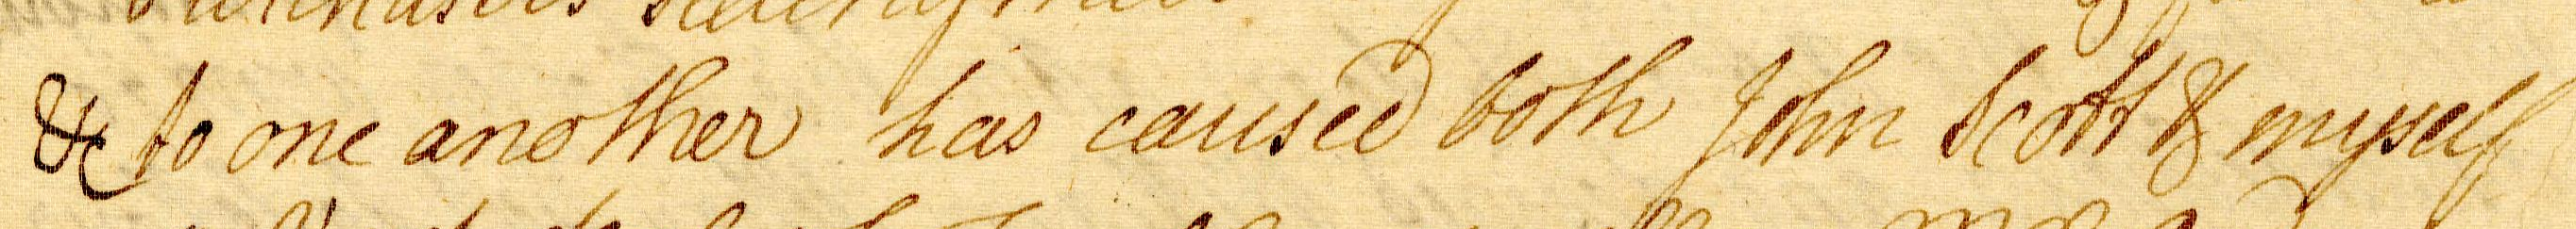& to one another has caused both John Scott & myself
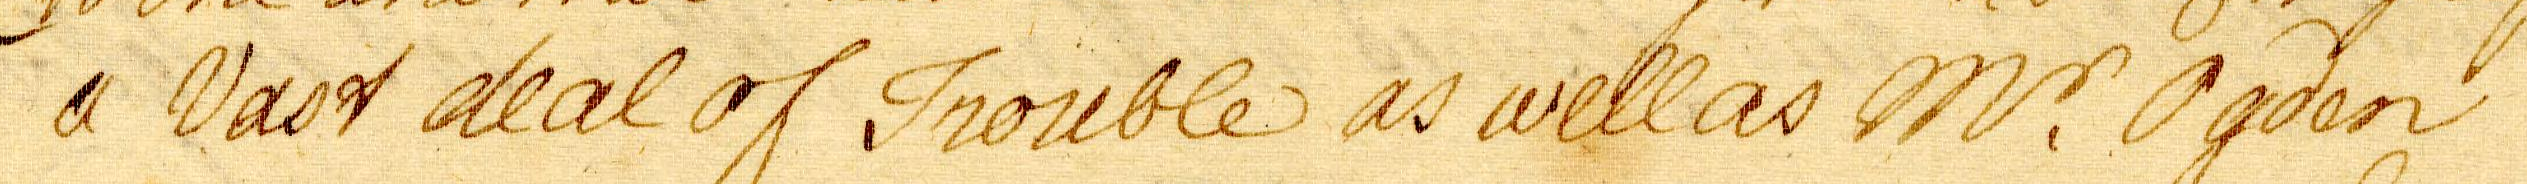a Vast deal of Trouble as well as M^r. Ogden
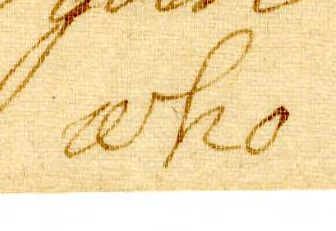who
